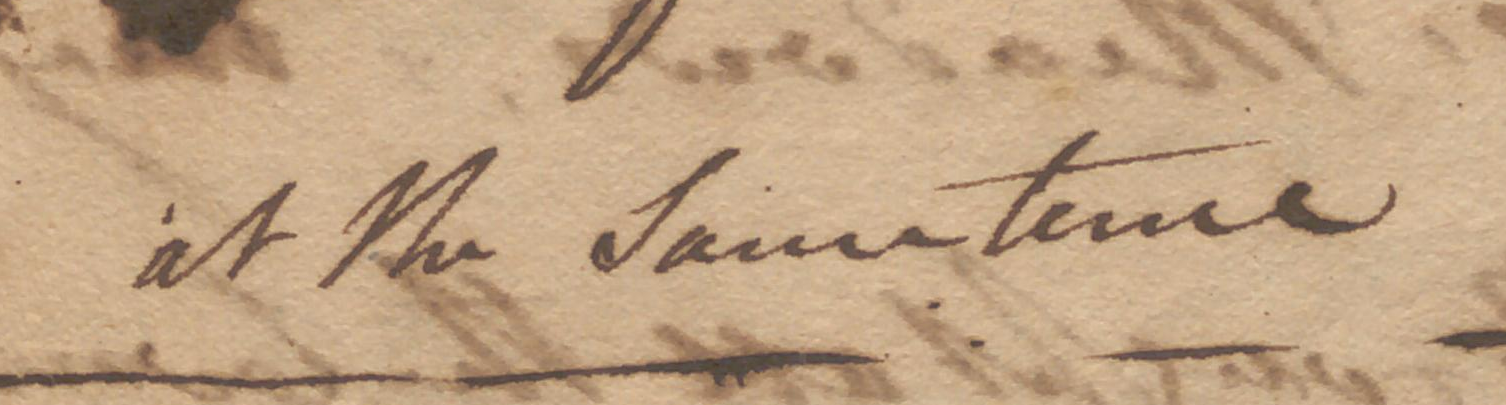at the Same time
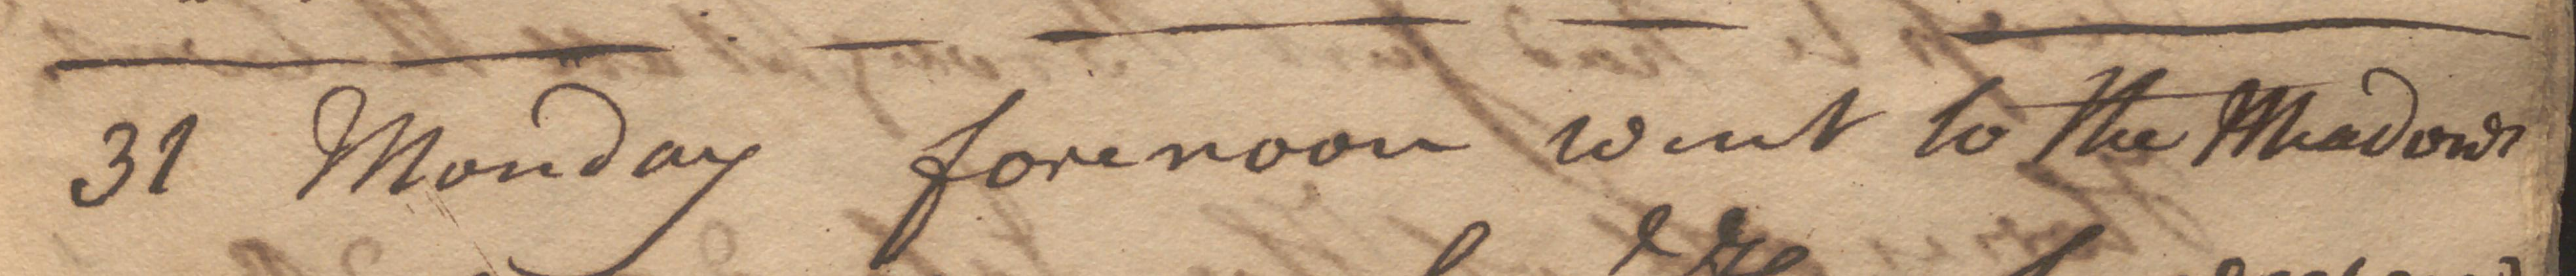31 Monday forenoon went to the Meadow
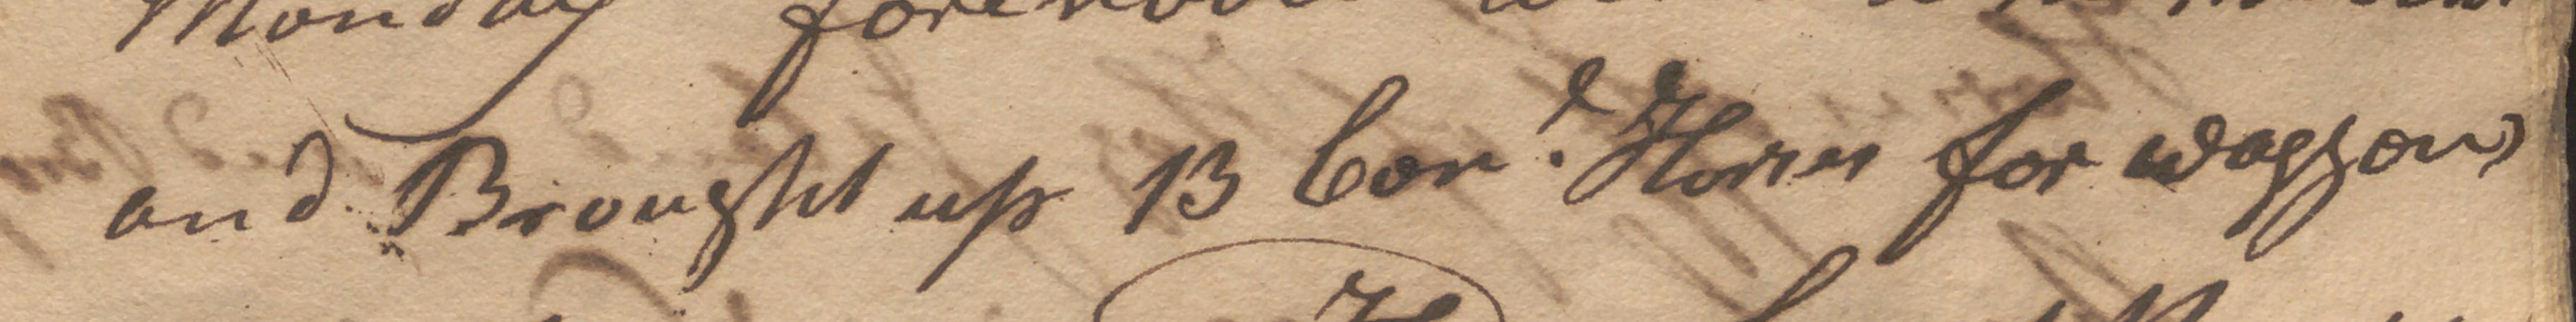and Brought up 13 Con^l. Horses for waggons
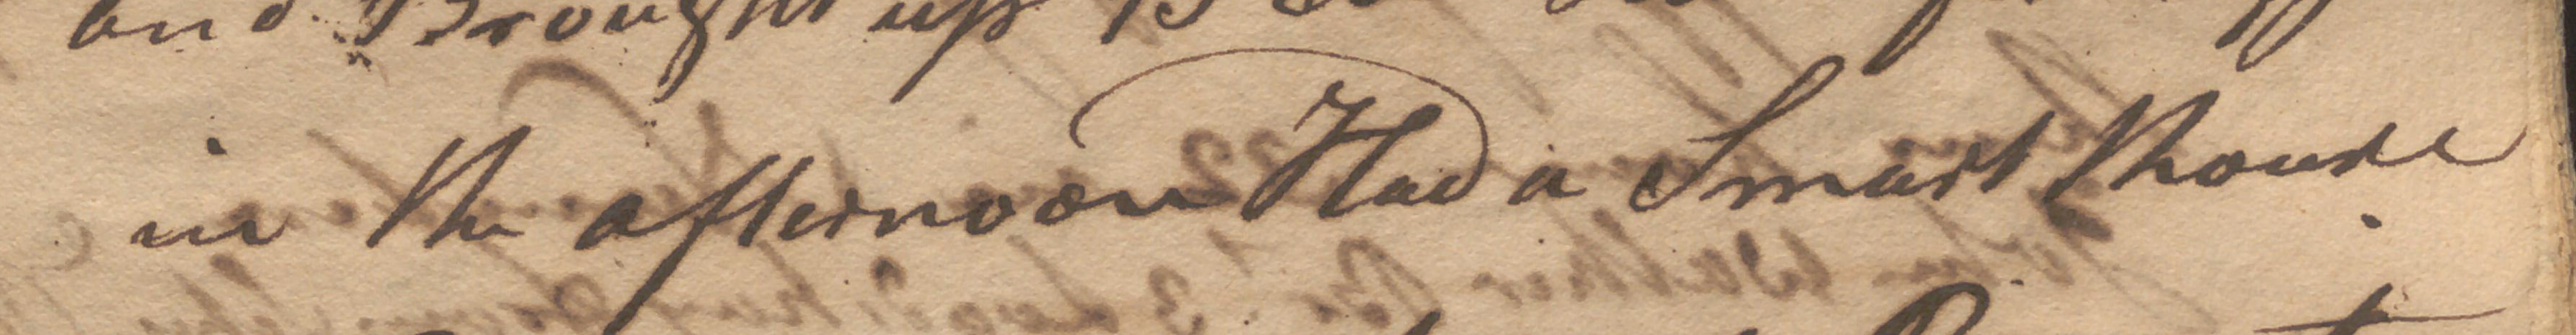in the afternoon Had a small shoure
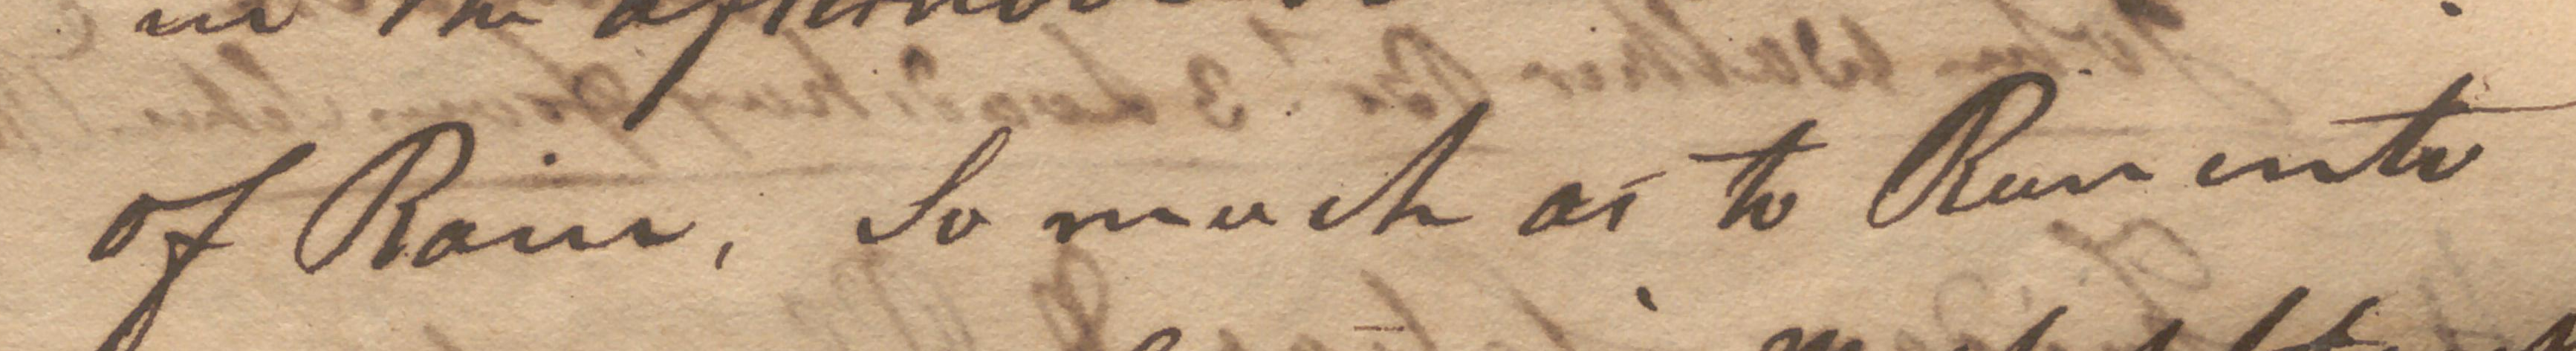of Raine, so much as to Run into
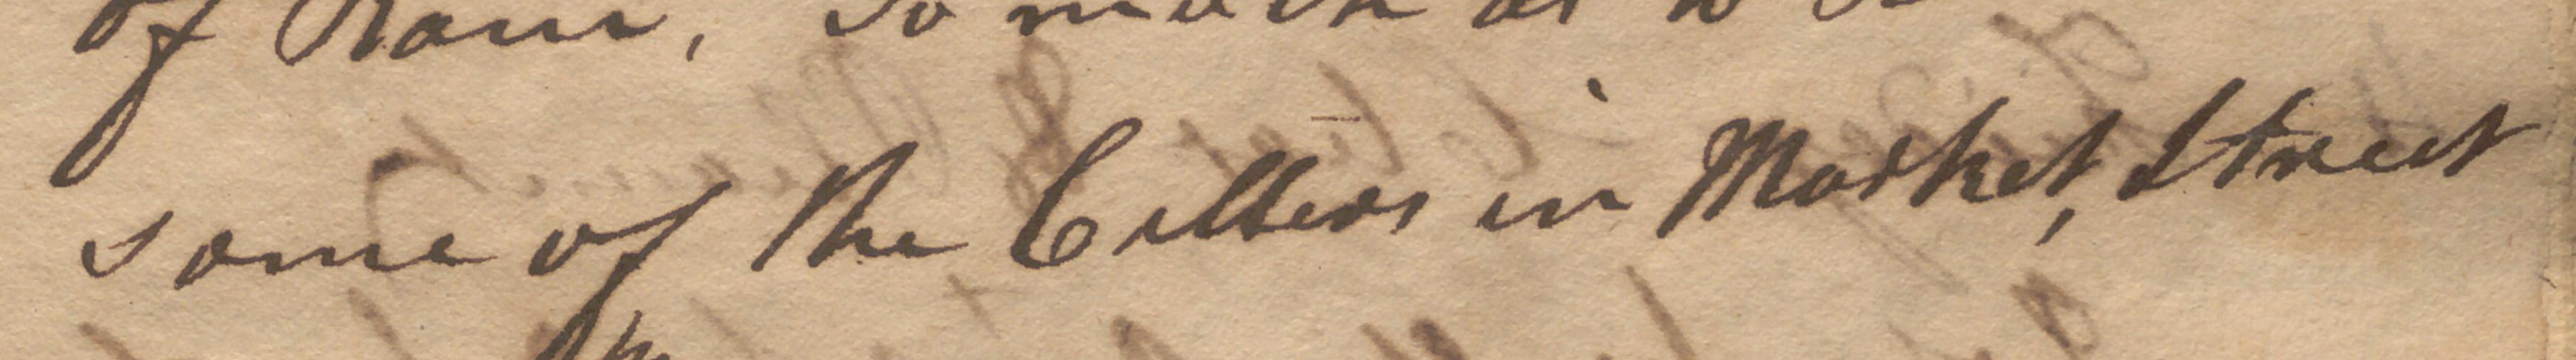some of the Cellers in Market Street
